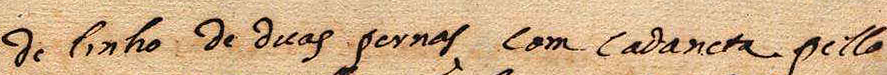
de linho de duas pernas com cadaneta pello
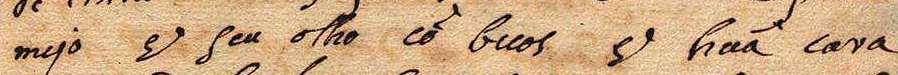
mejo E seu olho cō bicos E huā cara
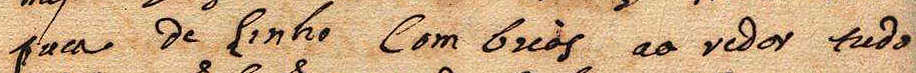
puça de linho com bicos ao redor tudo
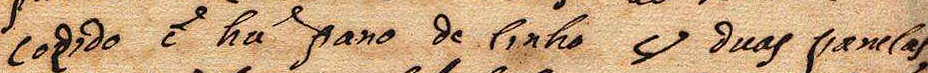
cozido ē hū pano de linho E duas panelas
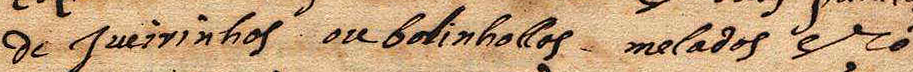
de Jueirinhos ou bolinhollos melados E cō
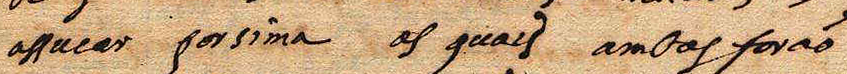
assucar por sima as quais ambos forão
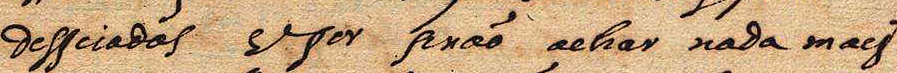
desseiadas E por se não achar nada maes
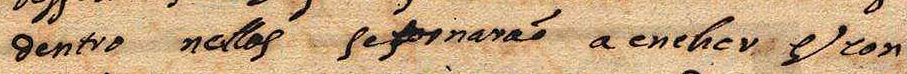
dentro nellas se tornarão a encher E con
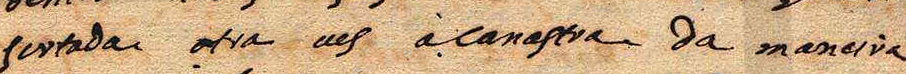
sertada otra ues a canastra da maneira
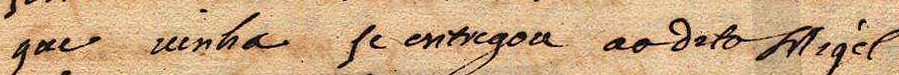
que uinha se entregou ao dito Migel
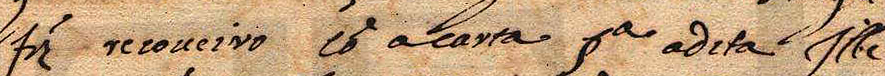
frz̄ recoueiro cō a carta pa a dita Jlle
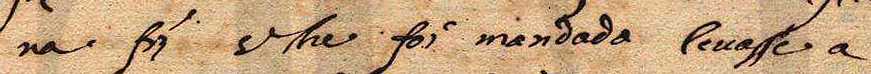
na frz̄ E lhe foi mandado leuasse a
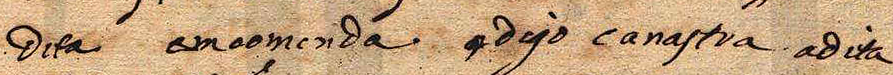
dita emcomenda e digo canastra a dita
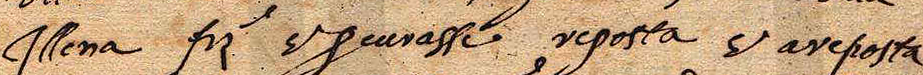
Jllena frz̄ E ꝓcurasse reposta E a reposta
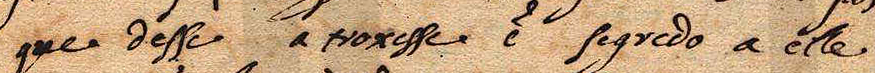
que desse a troxesse ē segredo a elle
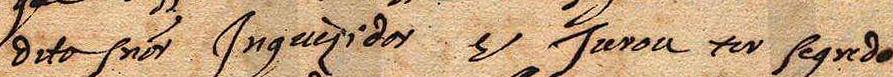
dito snōr Jnquezidor E Jurou ter segredo
